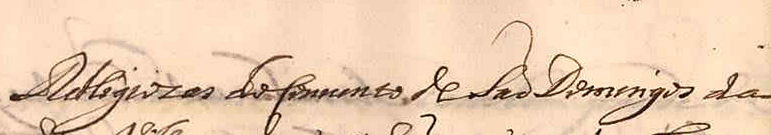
Relligiozas do Conuento de Saõ Domingos da
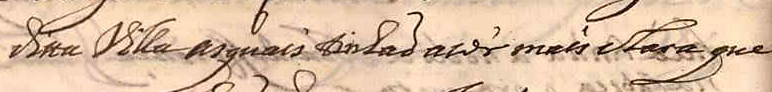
ditta Villa as quais tinhaõ a cor mais clara que
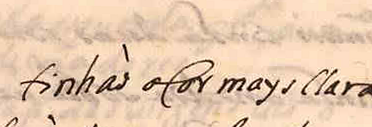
tinhaõ a Cor mays clara
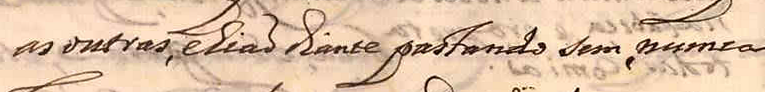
as outras, e hiaõ diante pastando sem numca
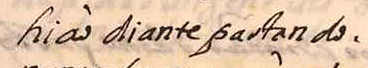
hiaõ diante pastando.
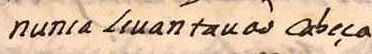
nunca leuantauaõ cabeça.
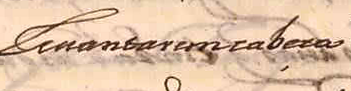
Leuantarem cabeça.
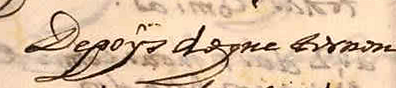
Depoys do que tornou
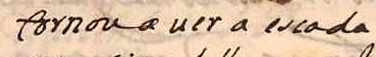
tornou a uer a escada
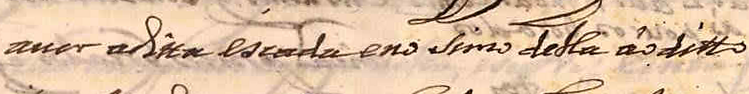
a uer a ditta escada e no simo della ao ditto
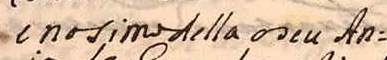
e no simo della o seu An
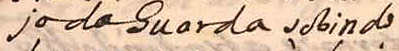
jo da Guarda sobindo
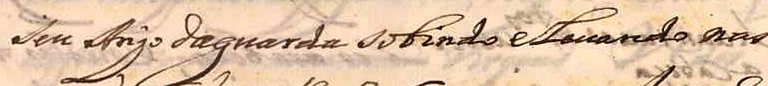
seu Anjo da guarda sobindo e leuando nas
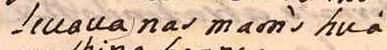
leuaua nas maons huā
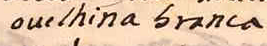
ouelhina branca
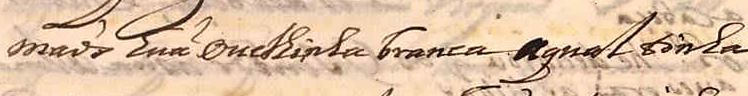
maõs huā ouelhinha branca a qual tinha
